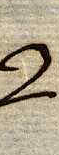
2
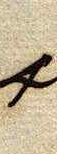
4
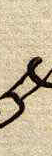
5
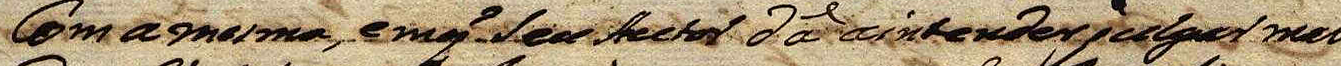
Com a mesma, em q̄ seu Autor dâ a intender julgar mal
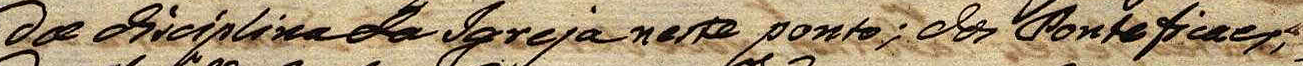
da disciplina da Igreja neste ponto; dos Ponteficaes,
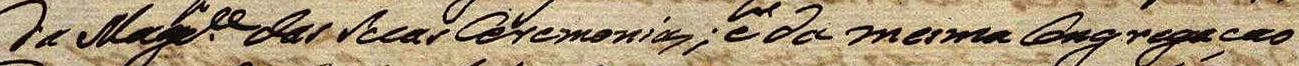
da Mag.de das suas Ceremonias; ê da mesma Congregaçaõ
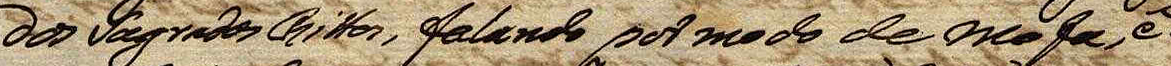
dos Sagrados Rittos, falando por modo de mosa, ê
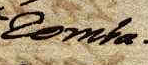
Comtra
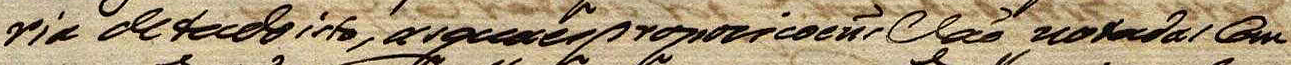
ria de tudo isto, as quaes propoziçoeñs vaõ notadas com
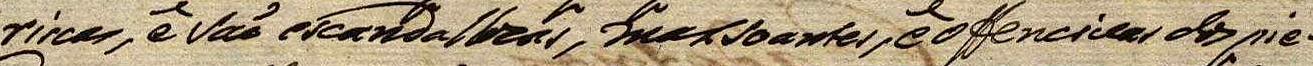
riscas, ê saõ escandallozas, malsoantes, ê offencivas dos pie
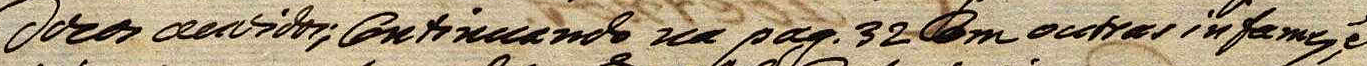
dozos ouvidos; Continuando na pag. 32 Com outras infames, ê
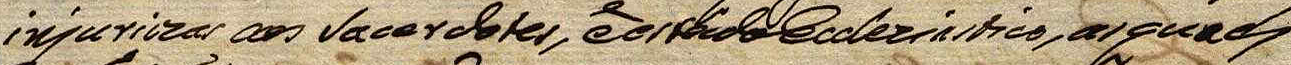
injuriozas aos sacerdotes, ê estado Eccleziastico, as quaes
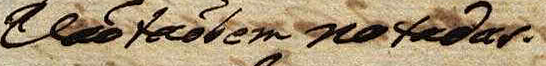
Vão taõbem notadas.
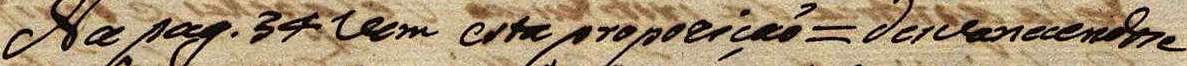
Na pag. 34 vem esta propoziçaõ = desvanecendose
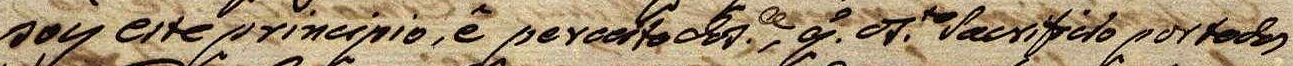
pois este principio, ê percerto do s.ce, q̄. o s.to Sacrificio por todos
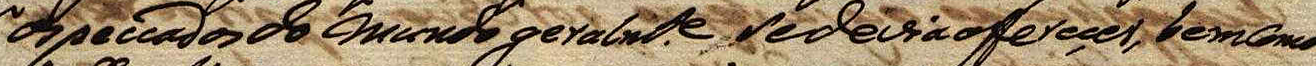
os peccados do mundo geralm.te se devia offereçer, bem como
